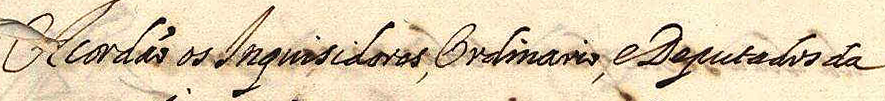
Acordaõ os Inquisidores, Ordinario, e Deputados da
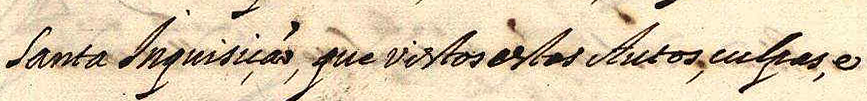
Santa Inquisiçaõ, que vistos estes Autos, culpas, e
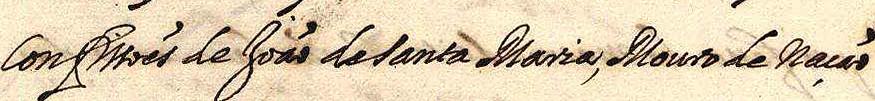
confissoẽs de Joaõ de Santa Maria, Mouro de Naçaõ
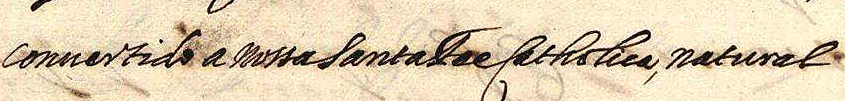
conuertido a nossa Santa Fee Catholica, natural
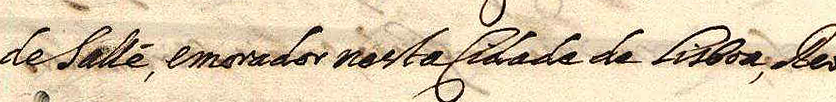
de Sallē, e morador nesta Cidade de Lisboa, Reo
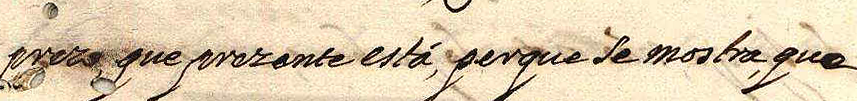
prezo, que prezente está, per que se mostra, que
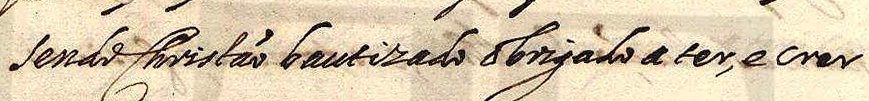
sendo Christaõ bautizado obrigado a ter, e crer
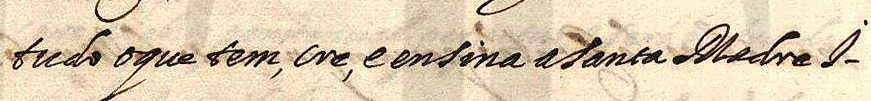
tudo o que tem, cre, e ensina a Santa Madre I
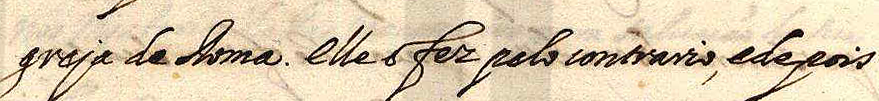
greja de Roma. elle o fez pelo contrario, e depois
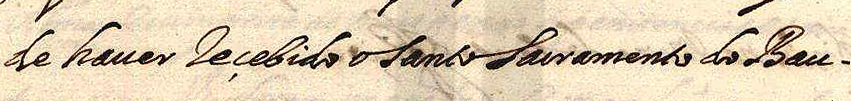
de hauer Reçebido o santo Sacramento do Bau
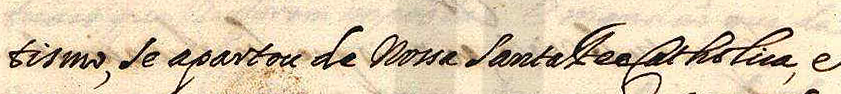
tismo, se apartou de Nossa santa Fee Catholica, e
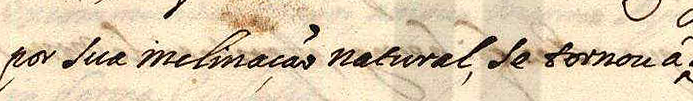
por sua inclinaçaõ natural, se tornou á
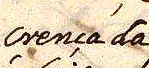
crença da
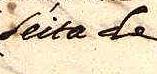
seita de
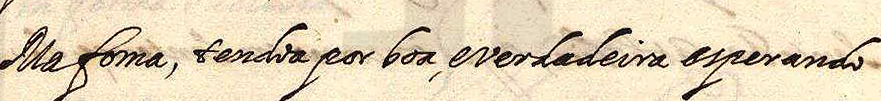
Mafoma, tendoa por boa, e verdadeira esperando
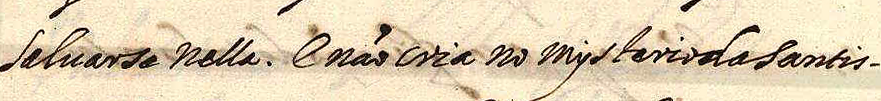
saluarse nella. E não cria no mysterio da santis
